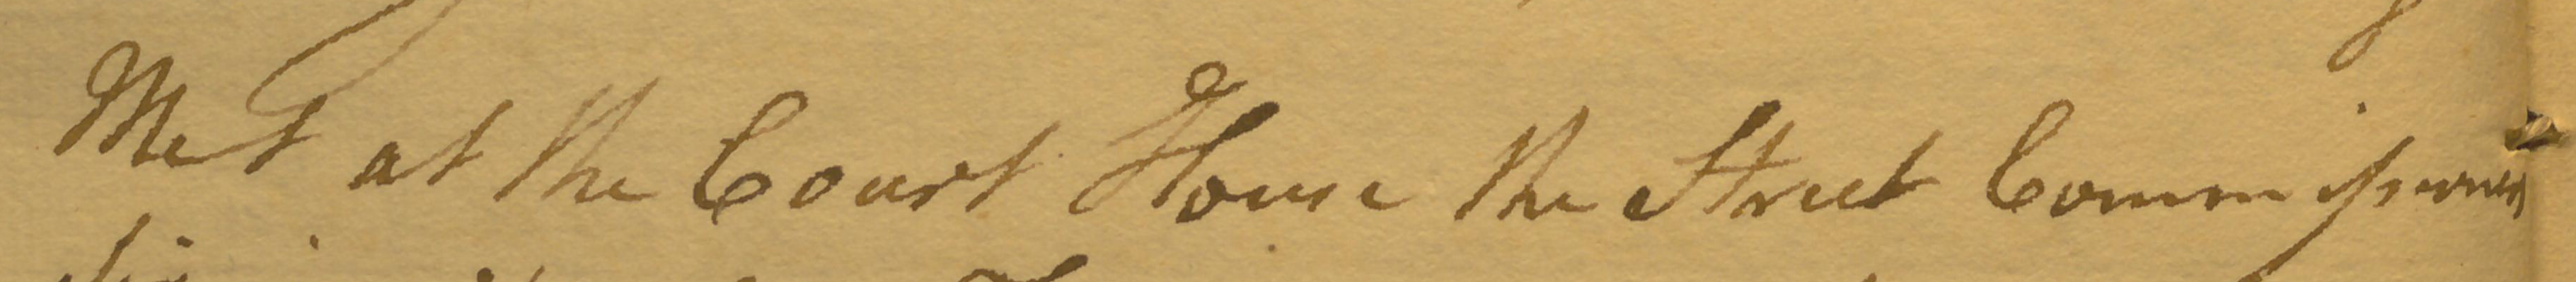Met at the Court House the Street Commissioners
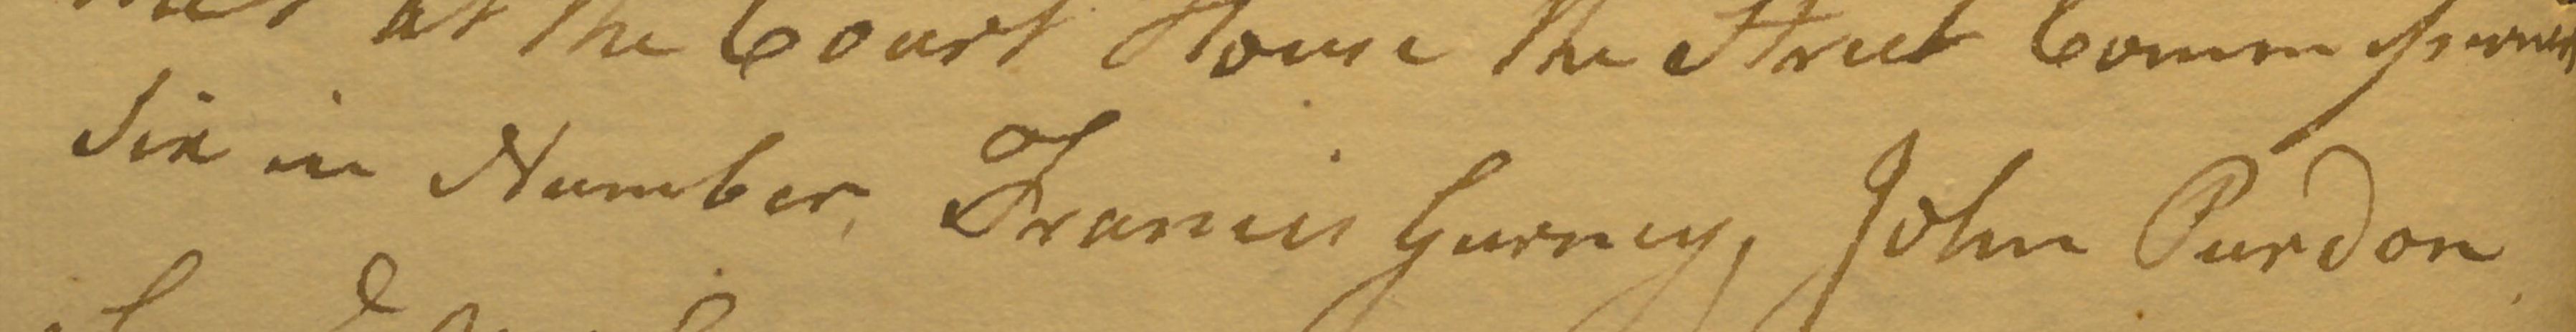Six in Number, Frances Gurney, John Purdon
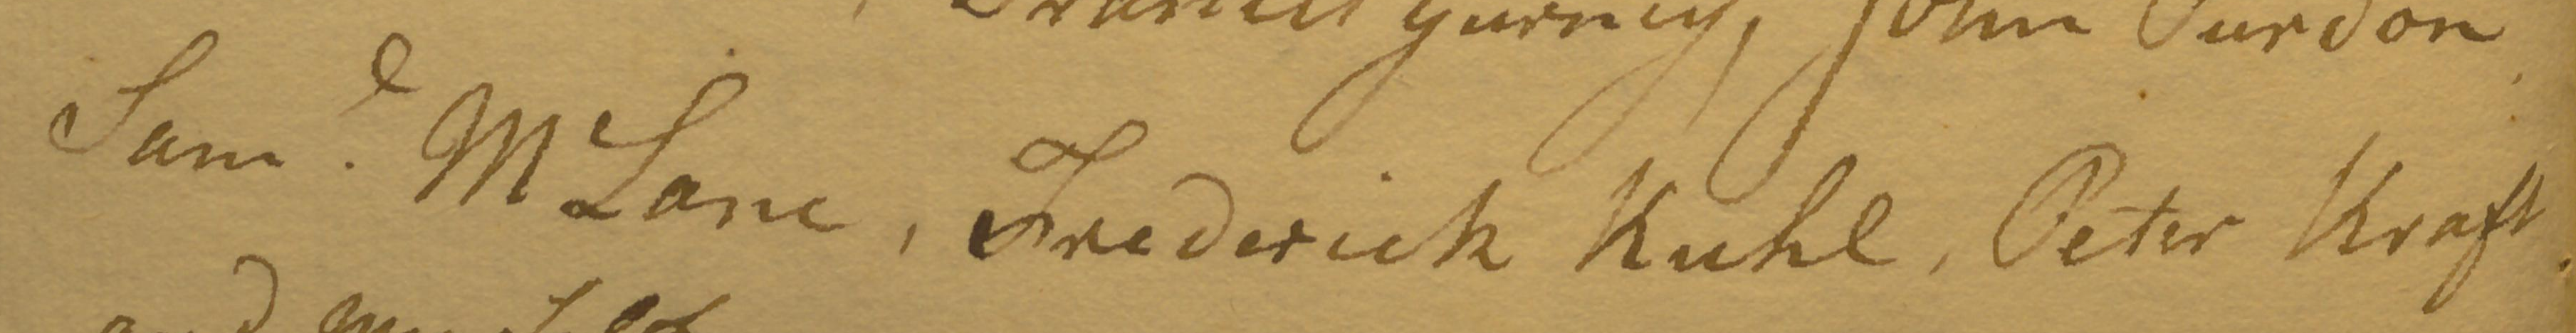Sam^l. M^c Lane, Frederick Kuhl, Peter Kraft
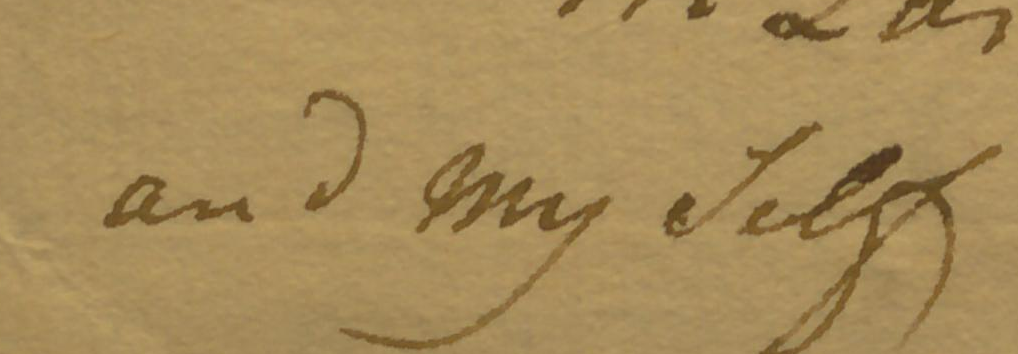and my self
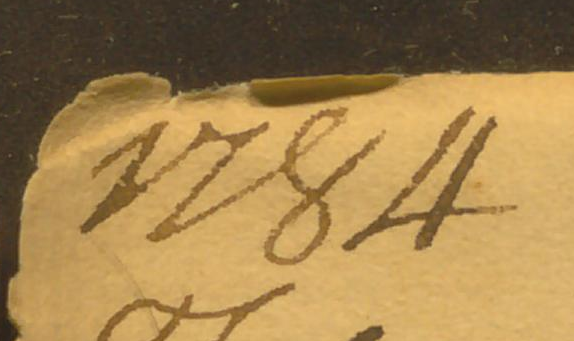1784
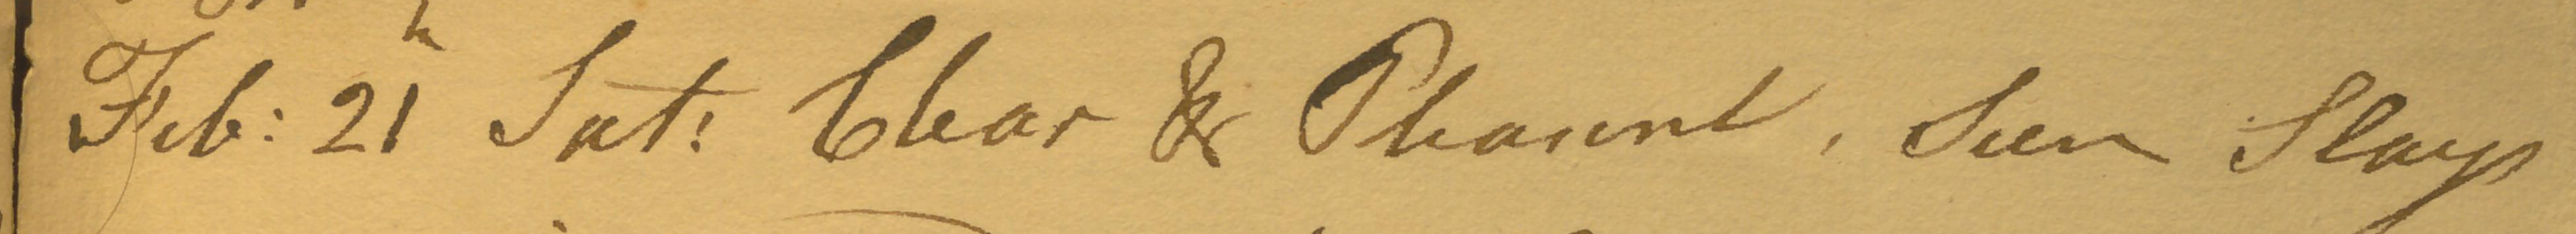Feb: 21^h Sat. Clear & Pleasent. Seen Slays
